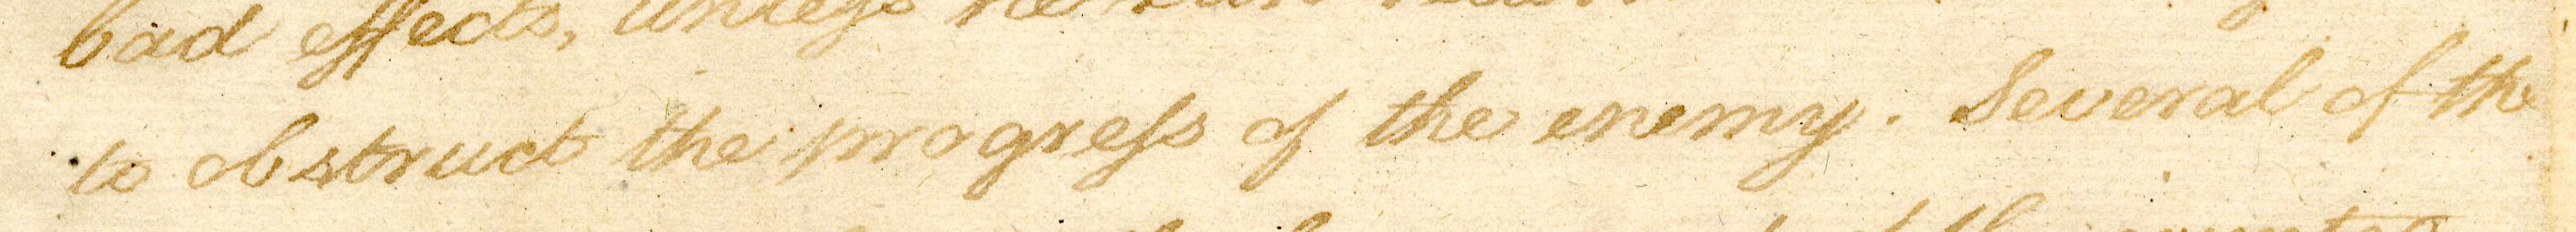to obstruct the progress of the enemy. Several of the
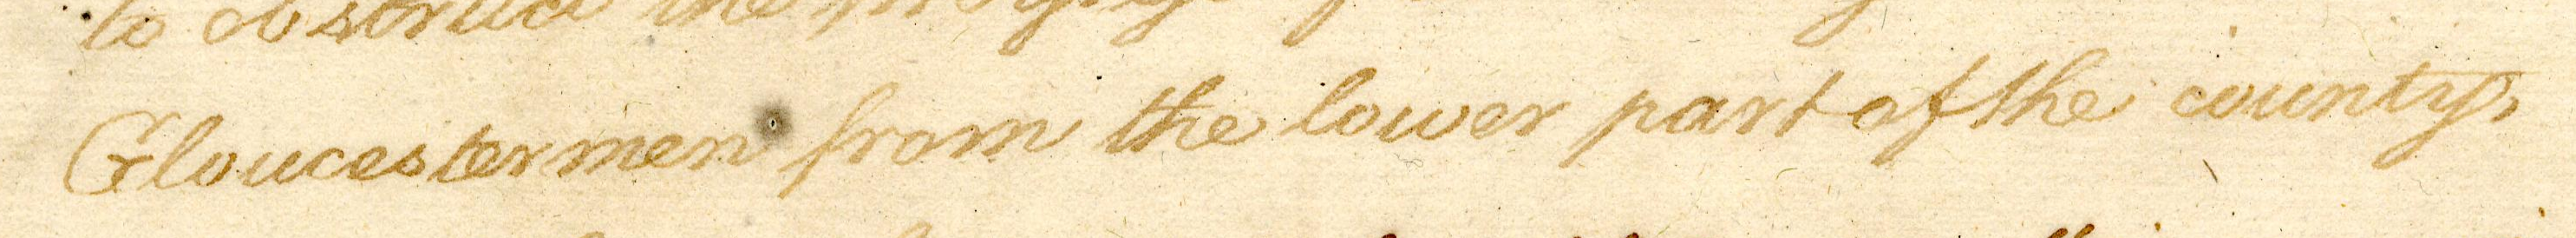Gloucestermen from the lower part of the county,
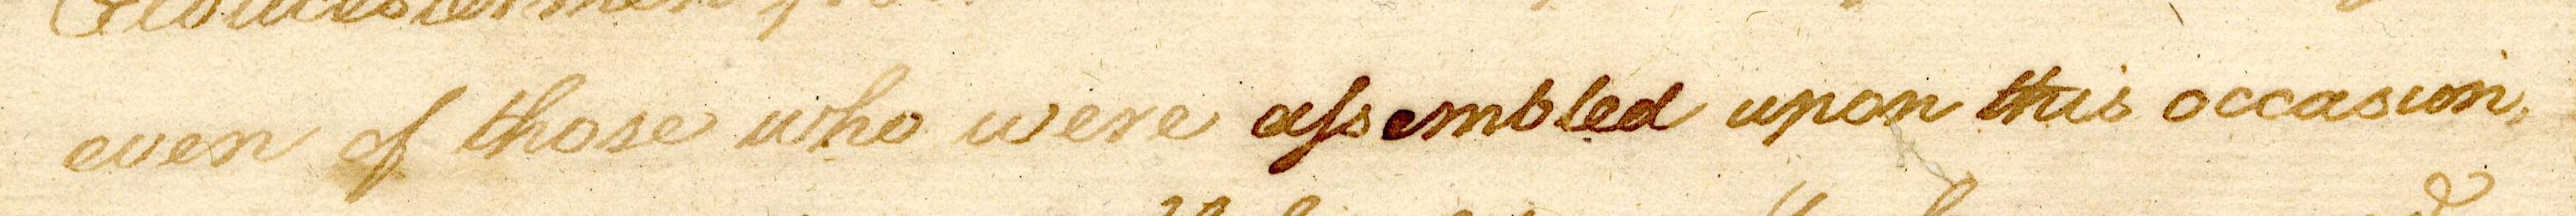even of those who were assembled upon this occasion,
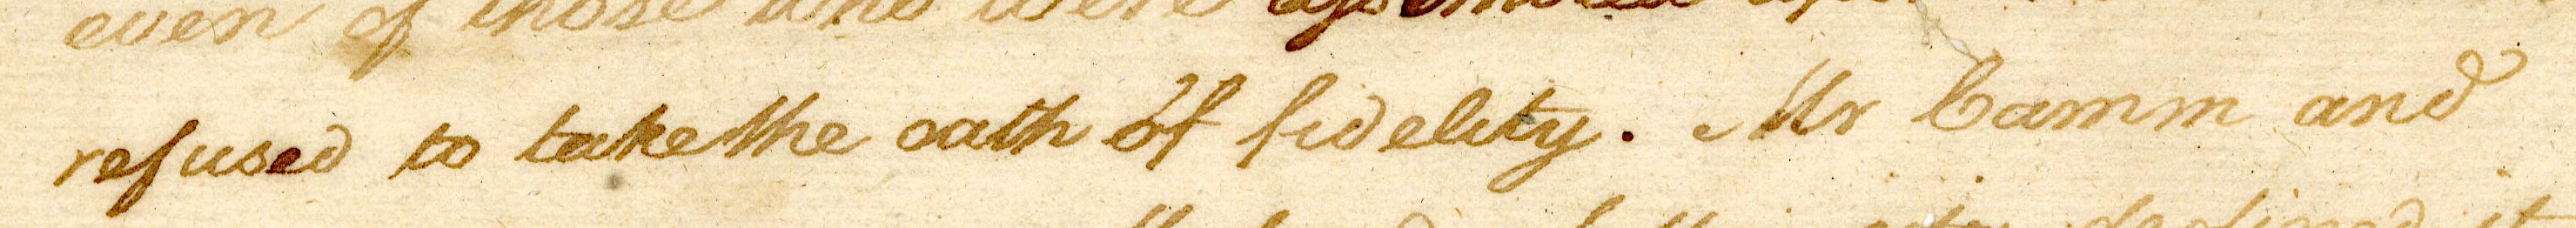refused to take the oath of fidelity. Mr Camm and
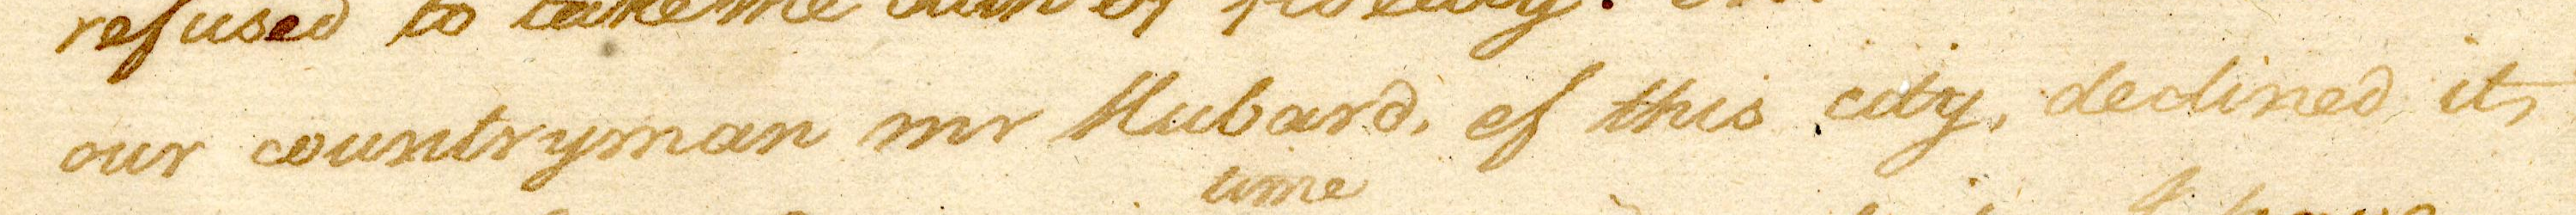our countryman Mr Hubard of this city, declined it
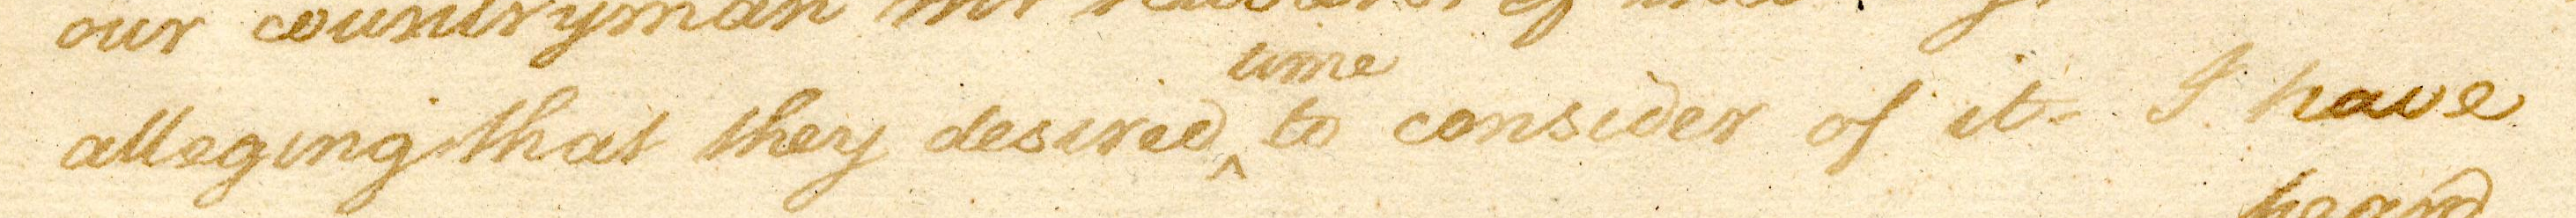alleging that they desired ^ to consider of it- I have
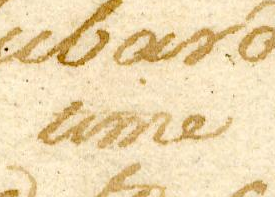time
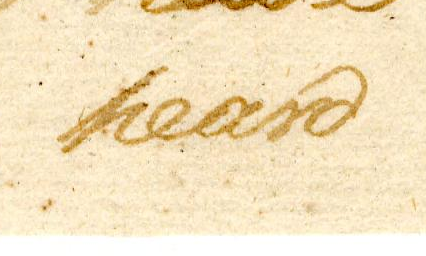heard
